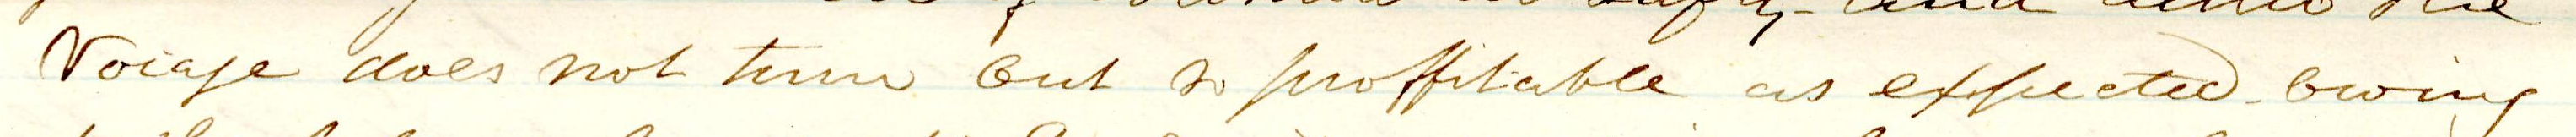Voyage does not turn out as proffitable as expected owing
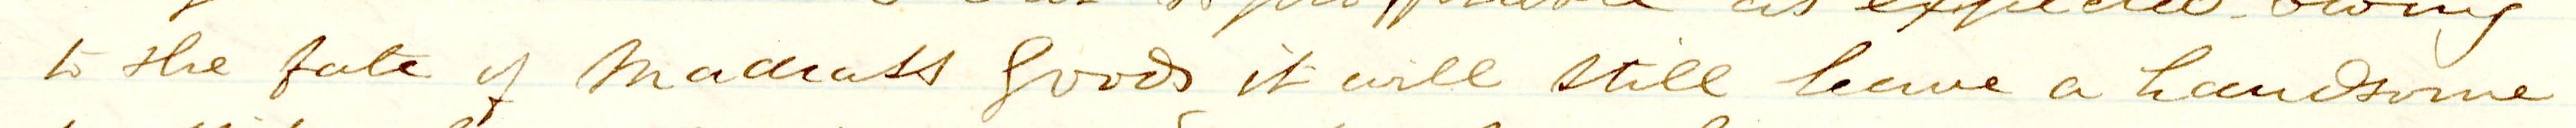to the fate of Madeall Goods it will still leave a handsome
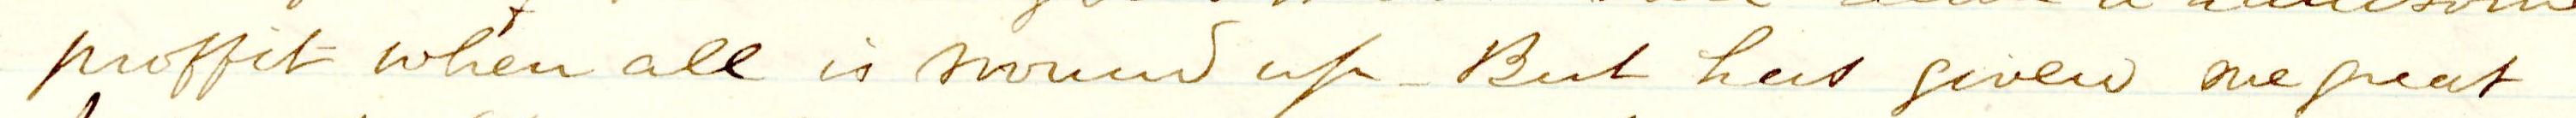proffit when all is round up- But he is given me great
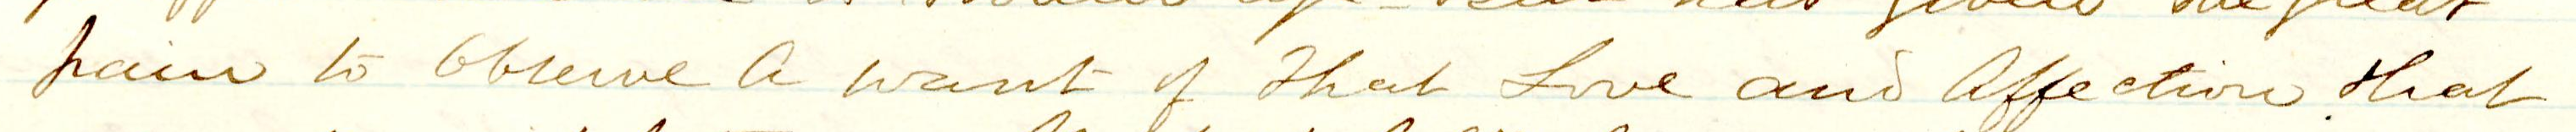pain to observe a want of that Love and Affection that
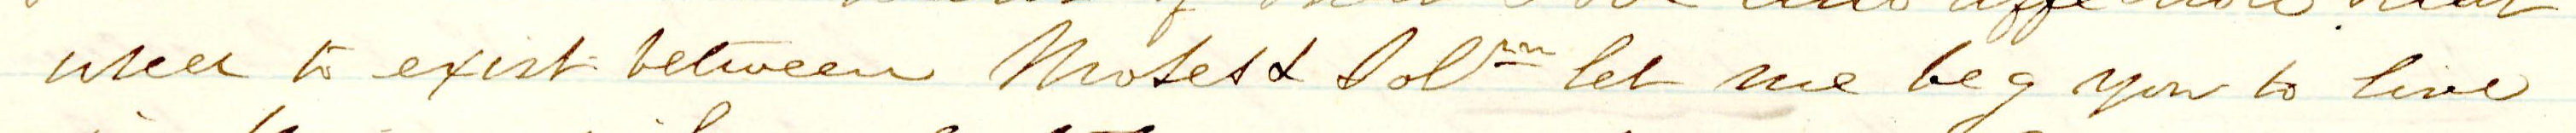used to extist between Moses & Sol^mn let me beg you to live
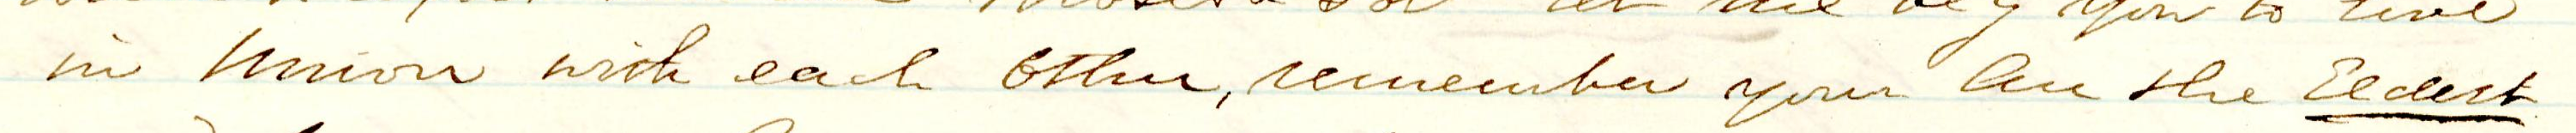in union with each other, remember your are the Eldest
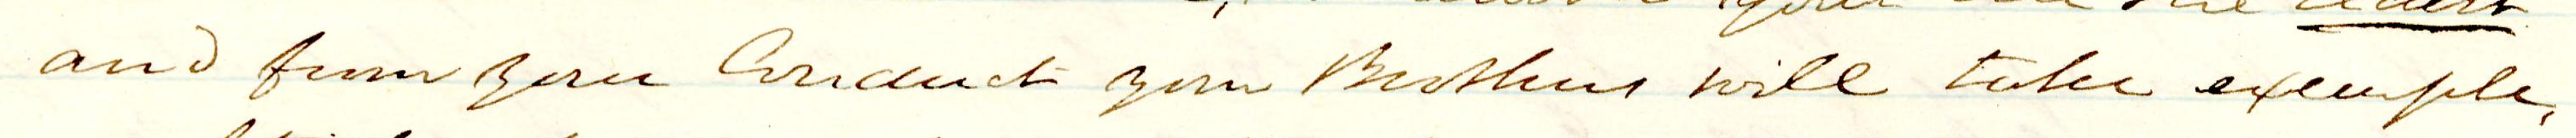and from your Conduct your Brothers will take example
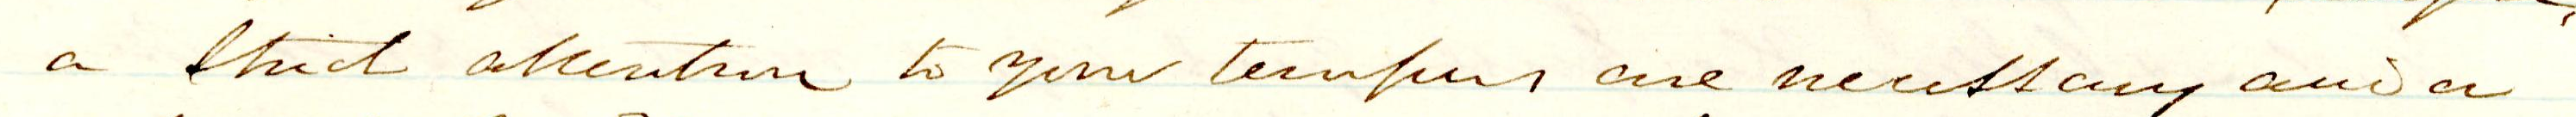a strict attention to your tempers are necessary and a
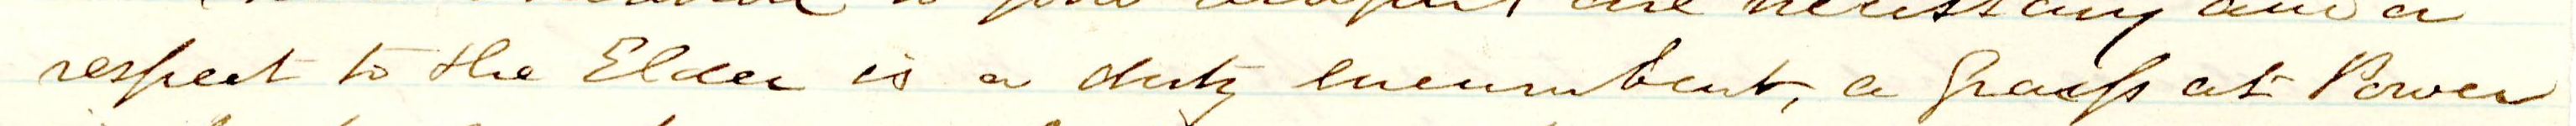respect to the Elder is a duty encumbent, a grasp at Power
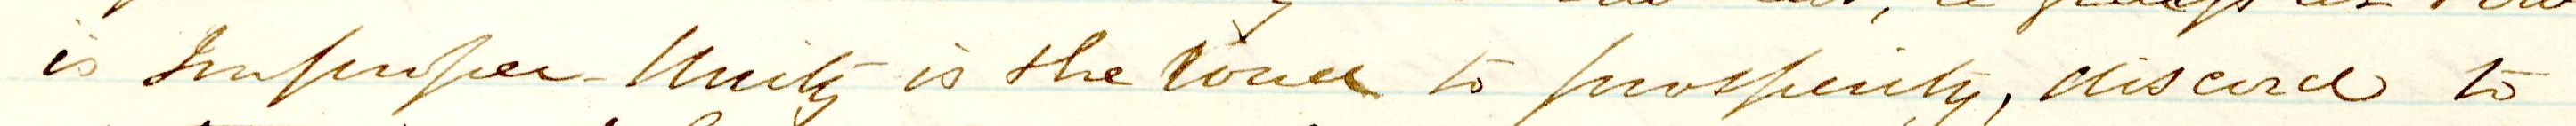is Improper- unity is the road to prosperity, discord to
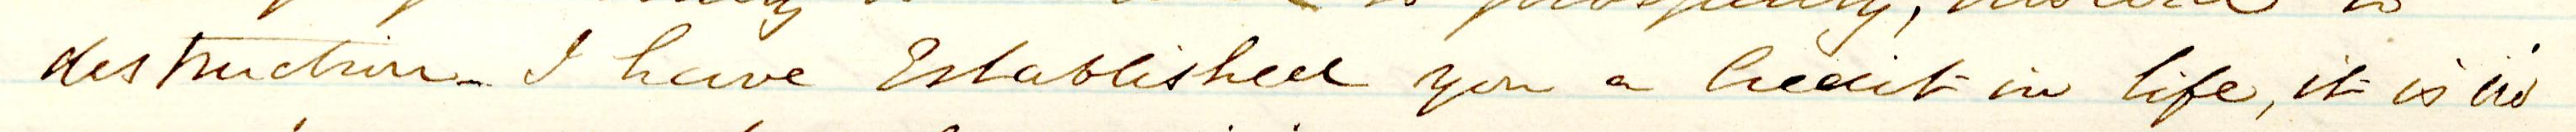destruction. I have Established you a Credit in life, it is in
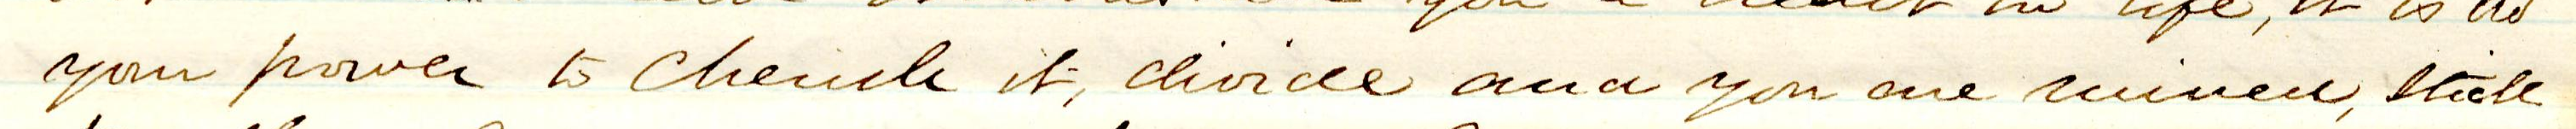your power to Cherish it, divide and you are received, stick
